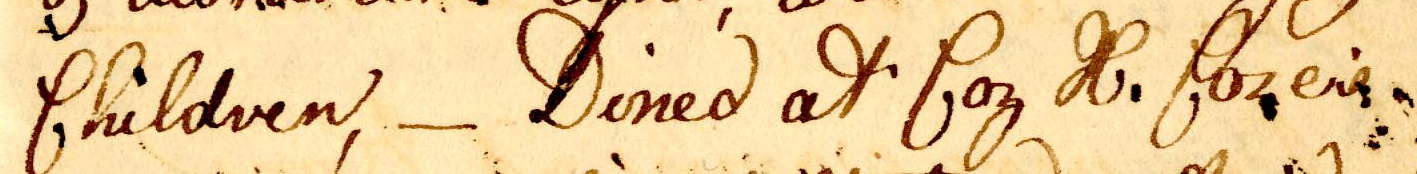Children, - Dined at Coz H. Coze's
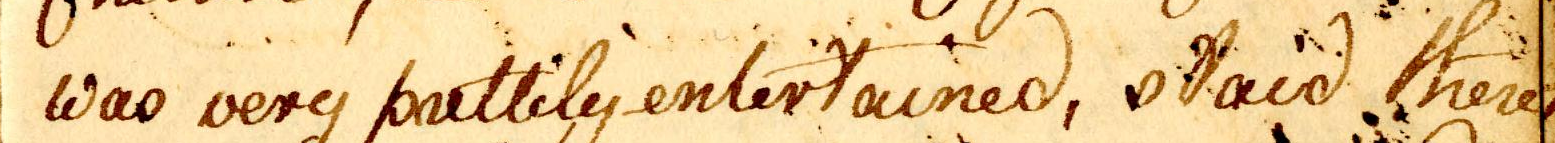was very prettily entertained, staid there
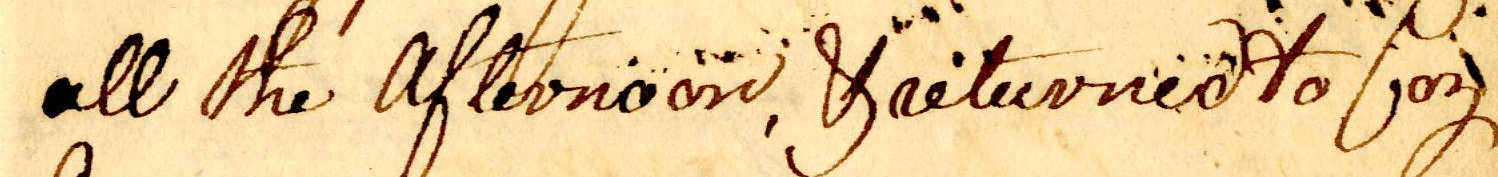all the Afternoon & returned to Coz
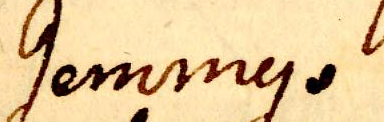Jemmys
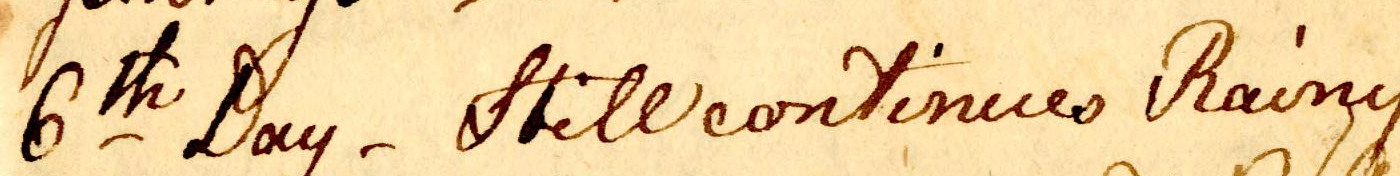6^th Day- Still continues Rainy,
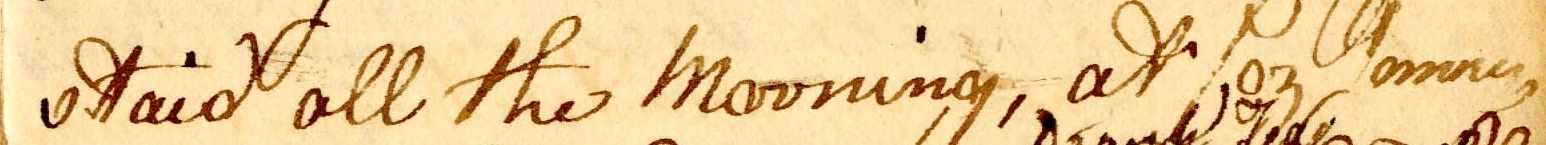staid all the morning at Coz Jemmy
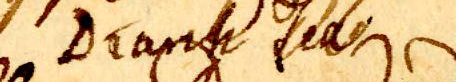Drank Tea
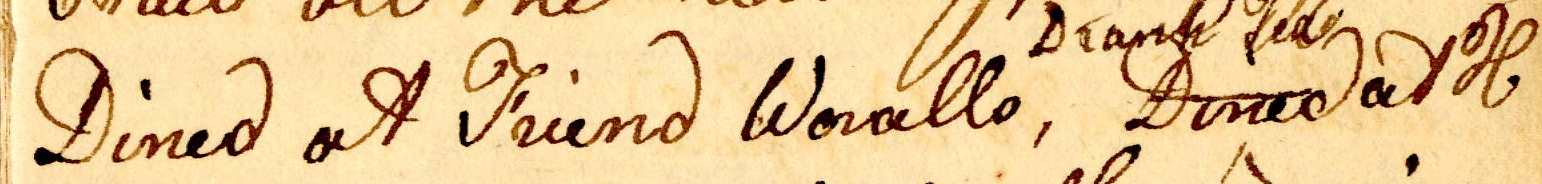Dined at Friend Woralls, Dined ^ at H
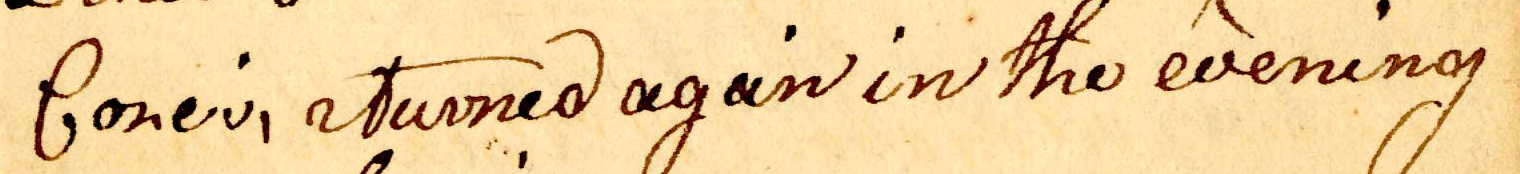Coze's, returned again in the evening
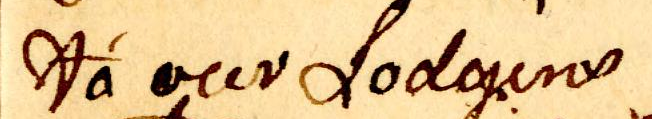to our Lodgins
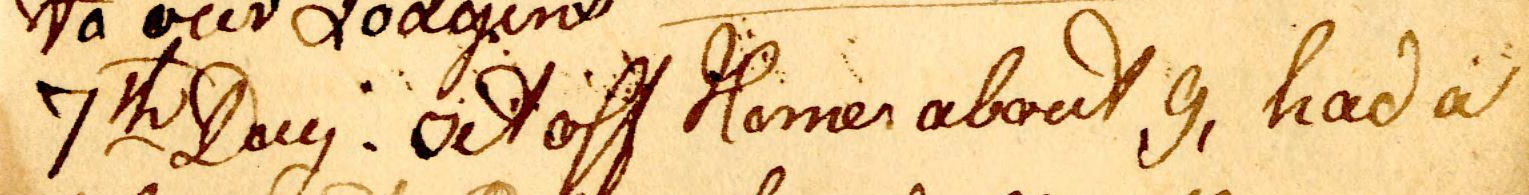7^th Day. set off Home about 9, had a
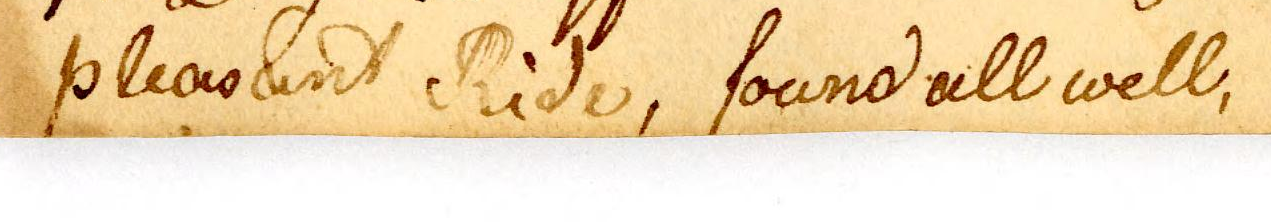pleasant Ride, found all well
